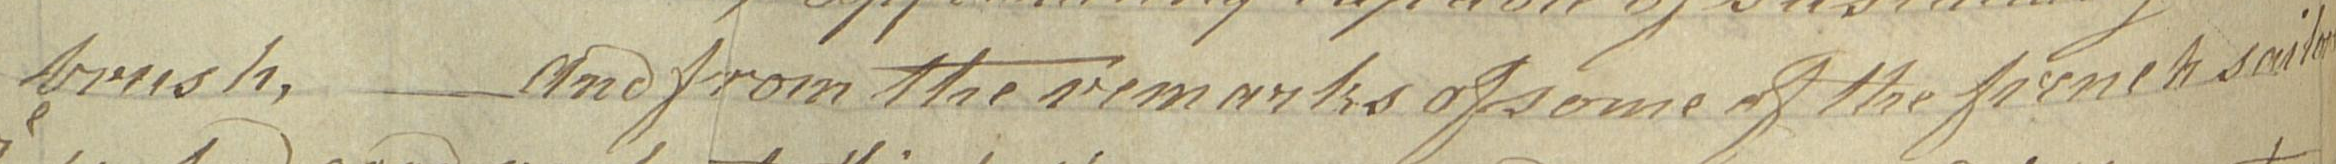brush, And from the remarks of some of the french sailors
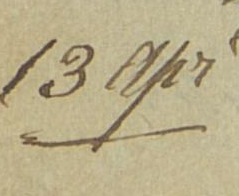13 Apr^l
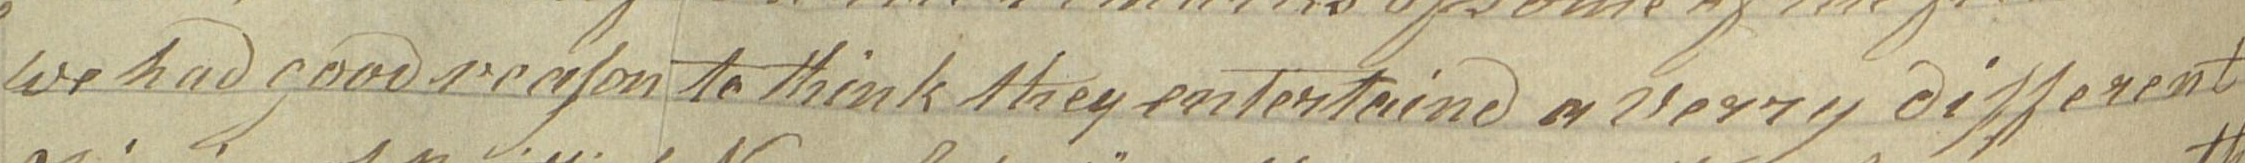we had good reason to think they entertaind a verry different
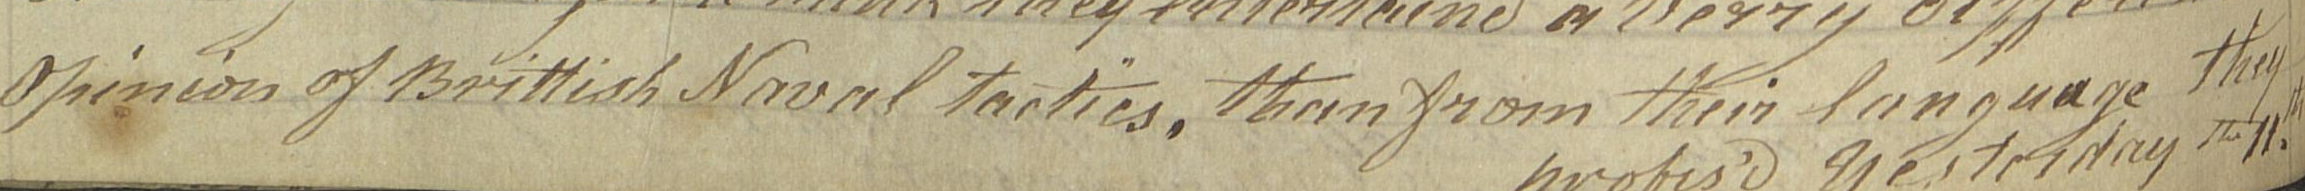Opinion of Brittish Naval tactics, than from their language, they
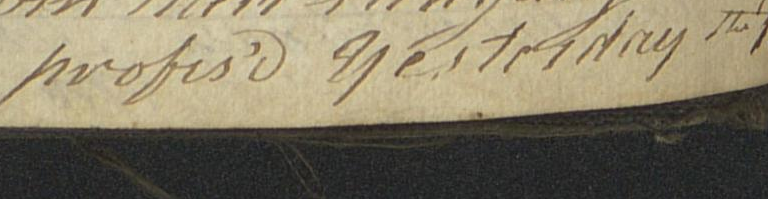profes'd yesterday the 11^th
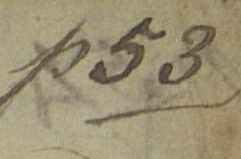p53
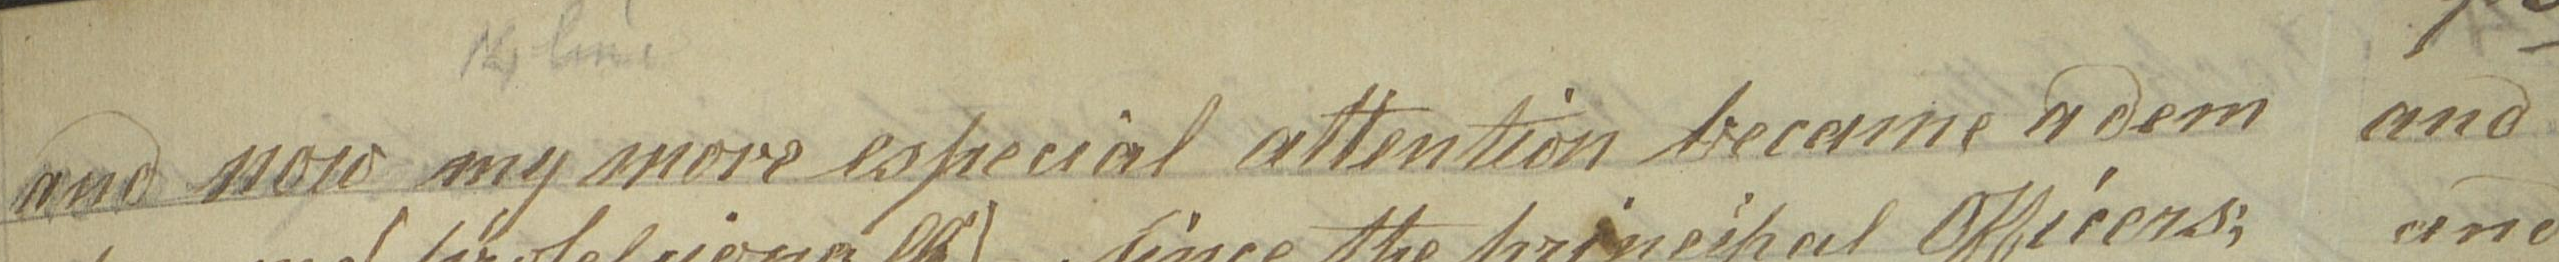and now my more especial attention became a dem and
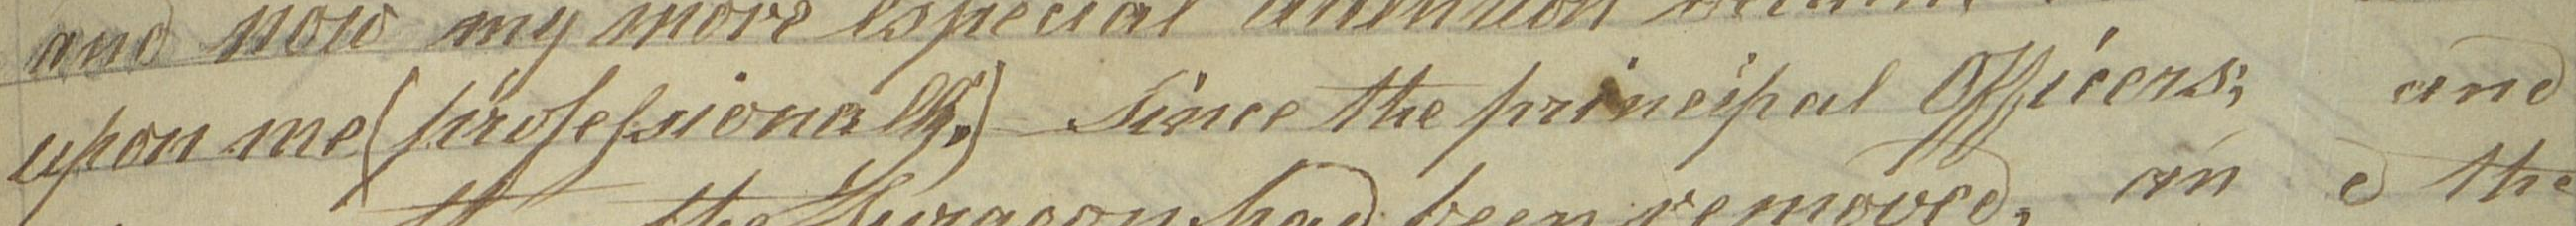upon me (professionally) since the principal Officers; and
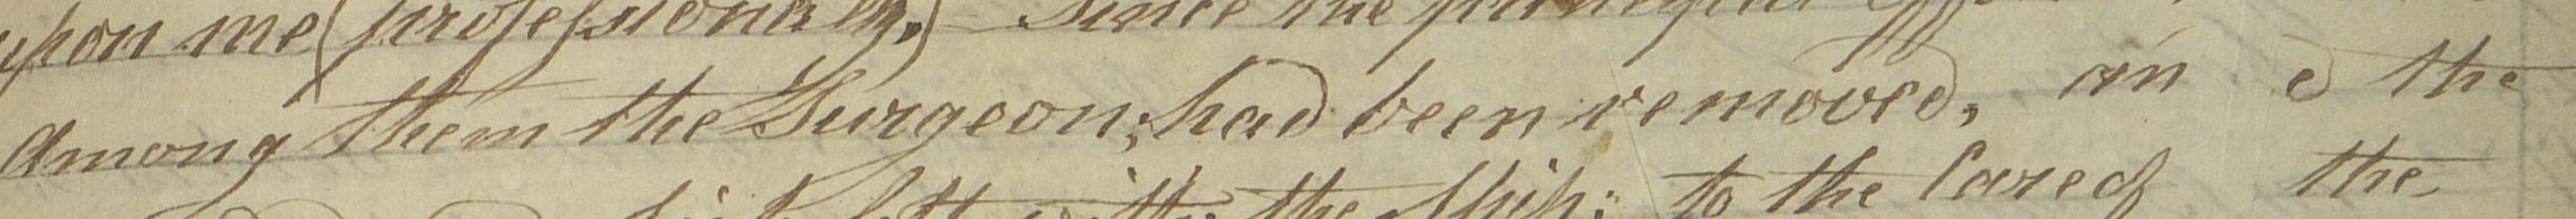among them the Surgeon; had been removed, an d the
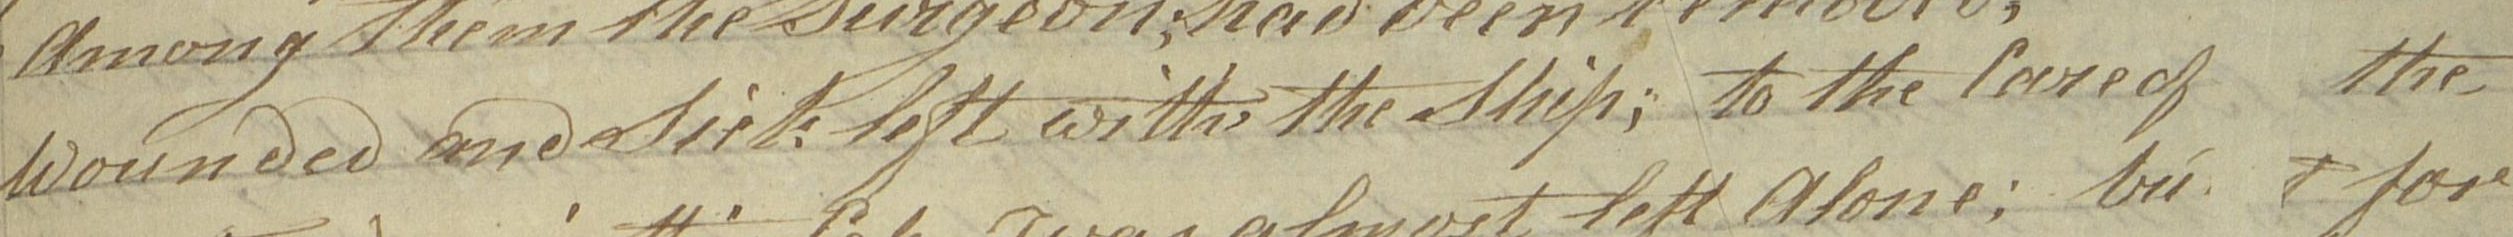wounded and Sick left with the ship; to the Care of the
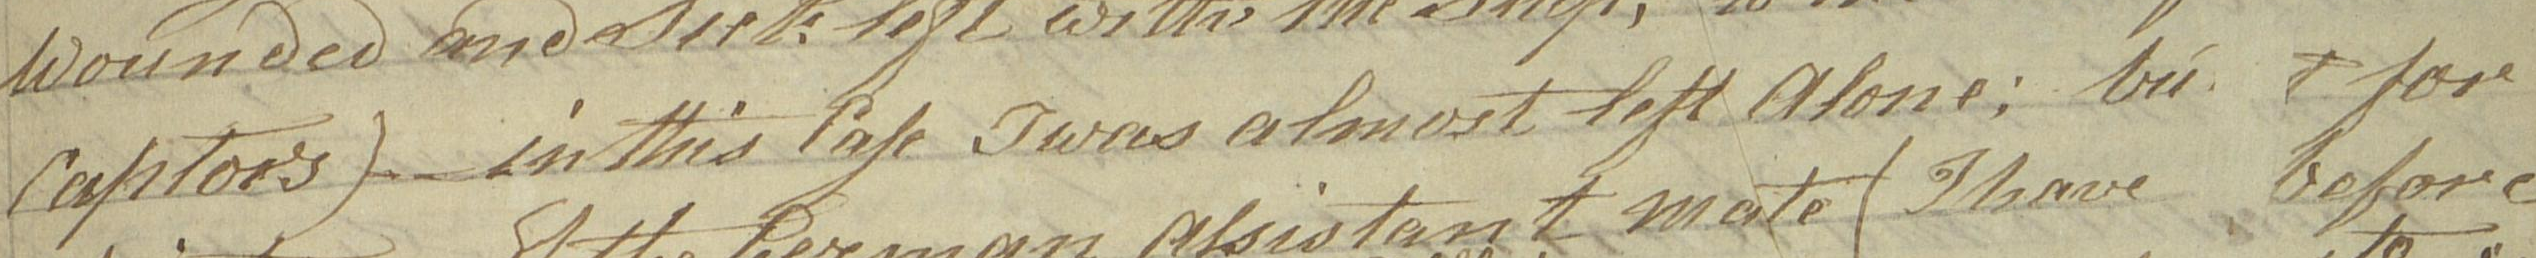captors) in this Case I was almost left Alone; bu[__]t for
